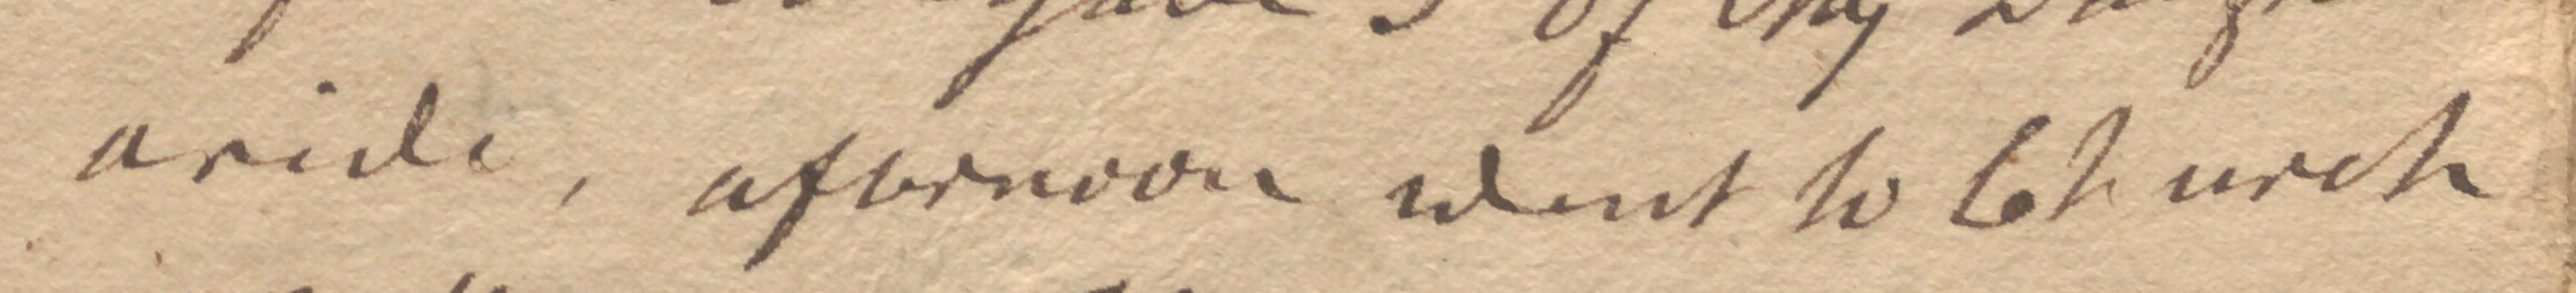a ride, afternoon went to Church
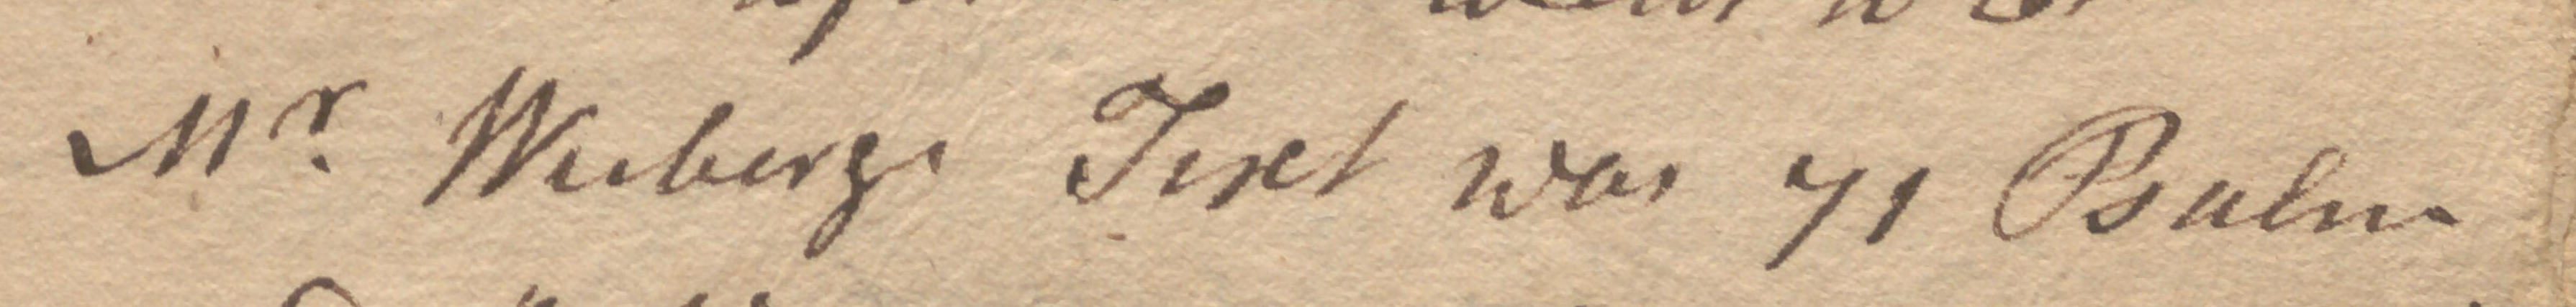M^r. Weibergs Text was 71 Psalm
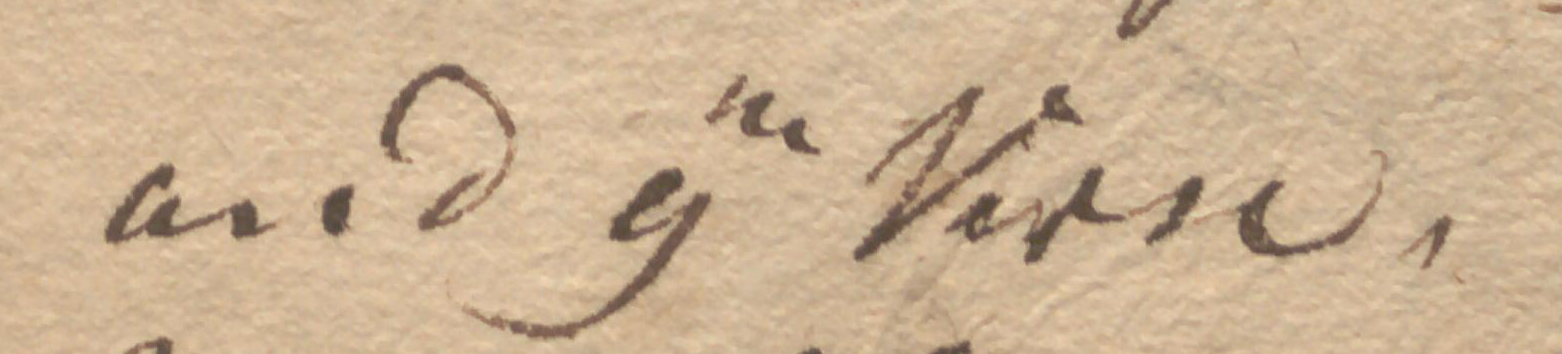and 9^th Verse,
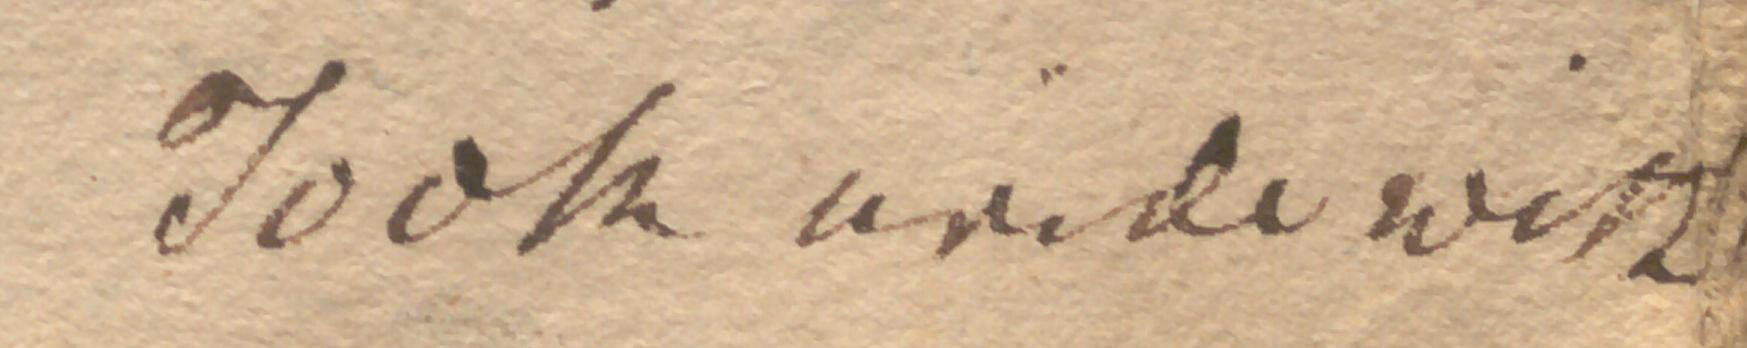Took a ride with
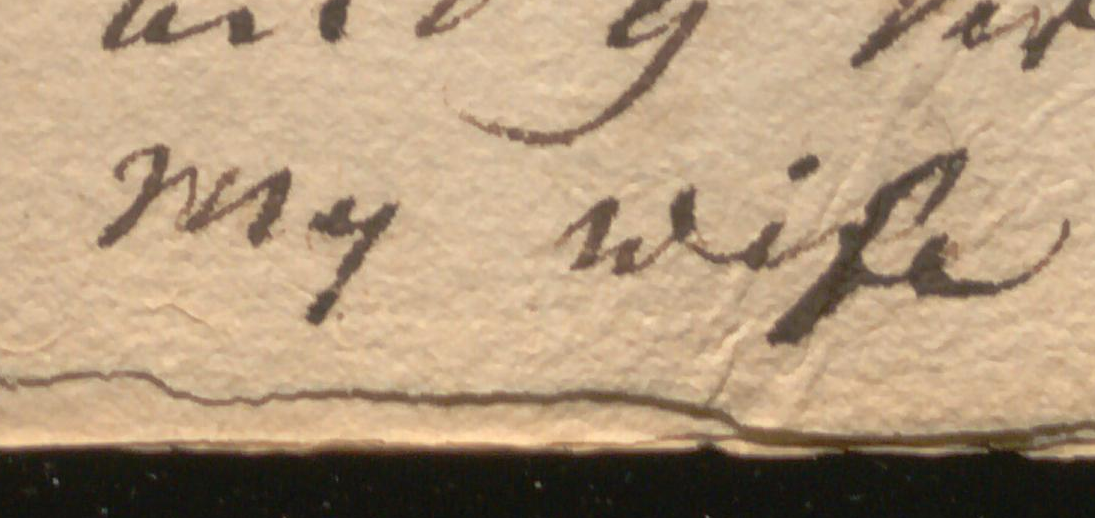my wife
